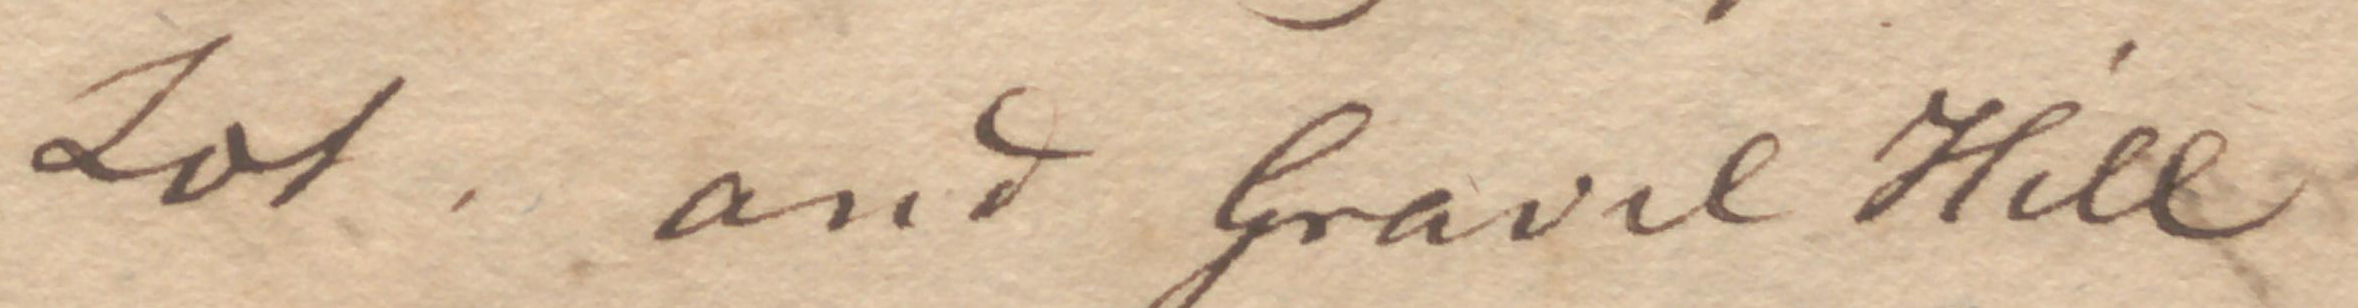Lot. and Gravel Hill
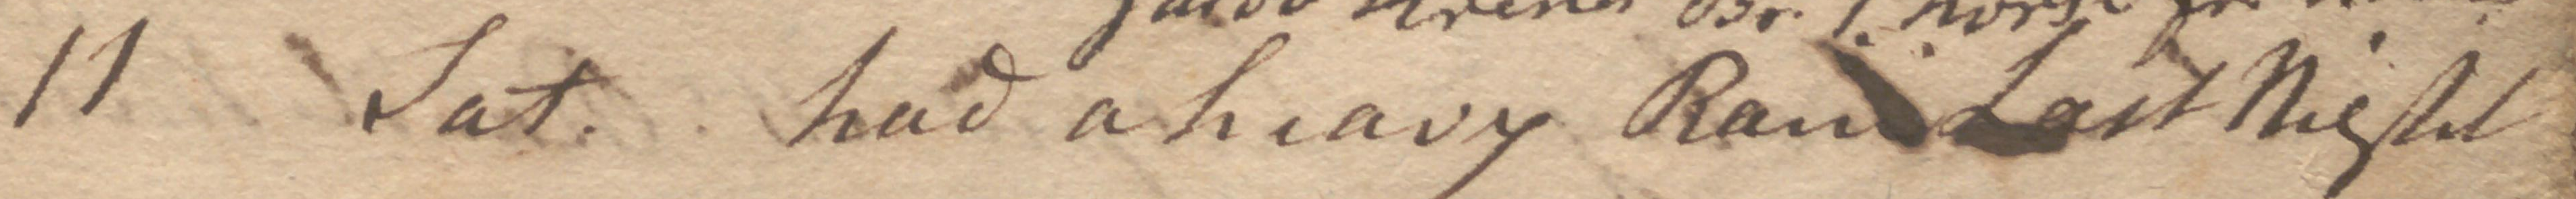17 Sat. had a heavy Rain Last Night
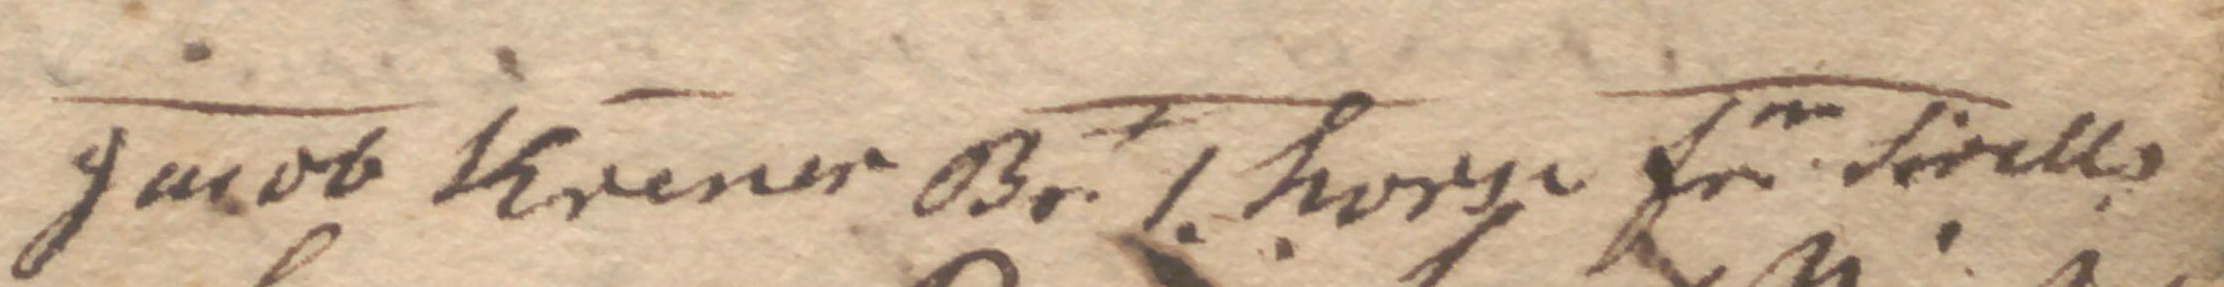Jasob Krener Br^t. 1 horse fr^m. Sirells
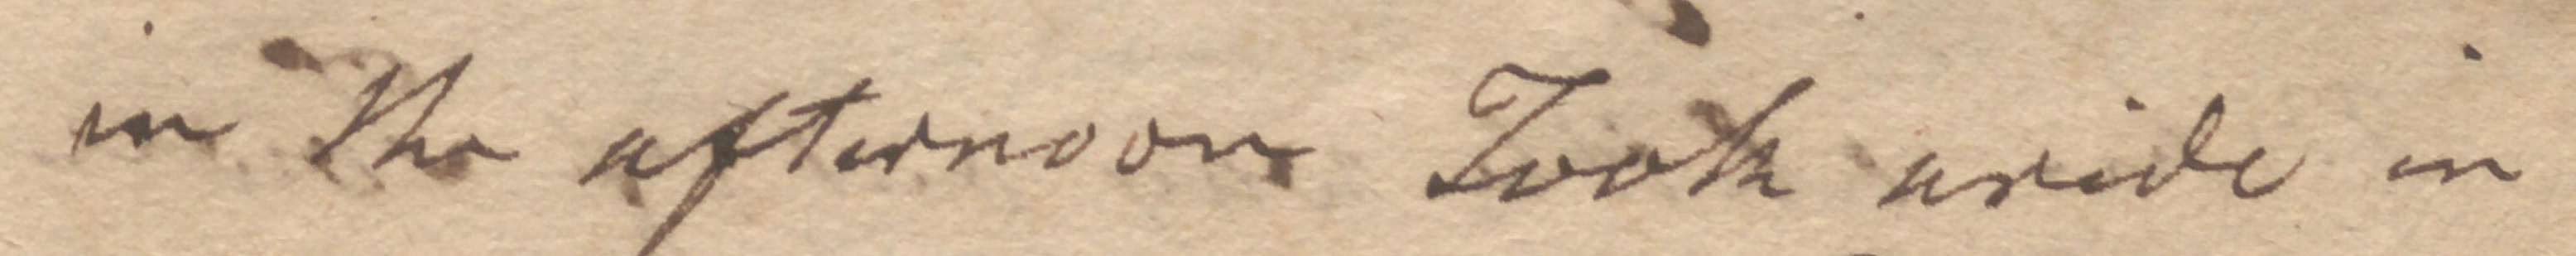in the afternoon Took a ride in
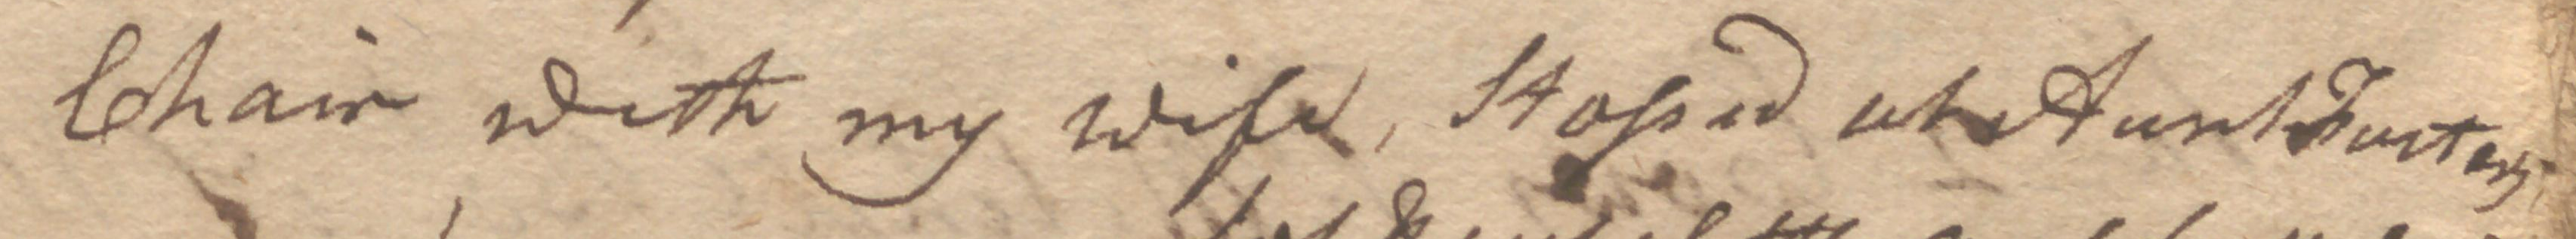Chair with my wife, Stoped at Aunt Fosters
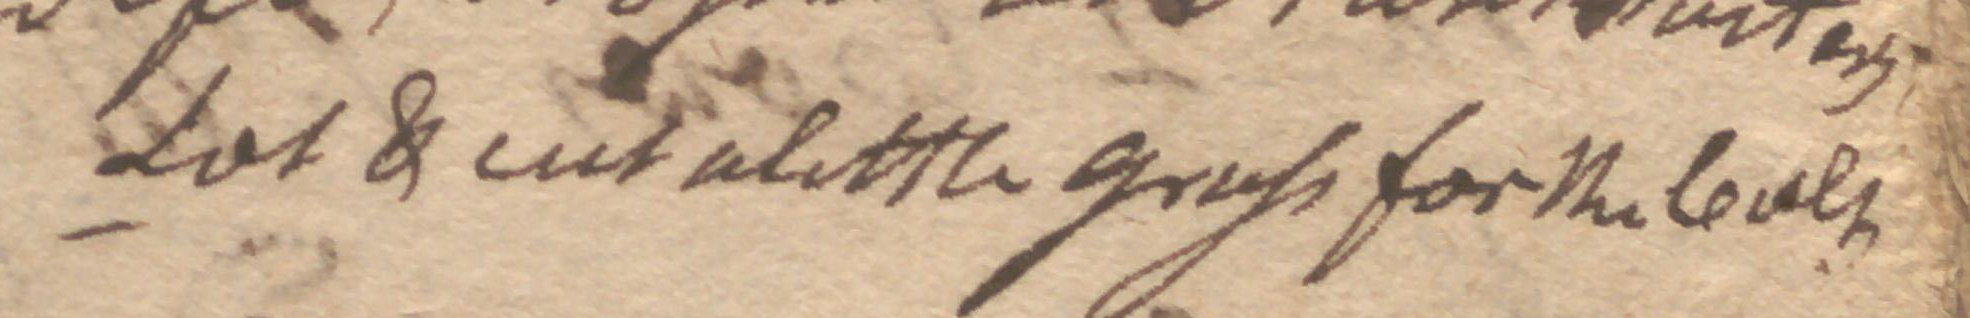Lot & cut a little grass for the Colt
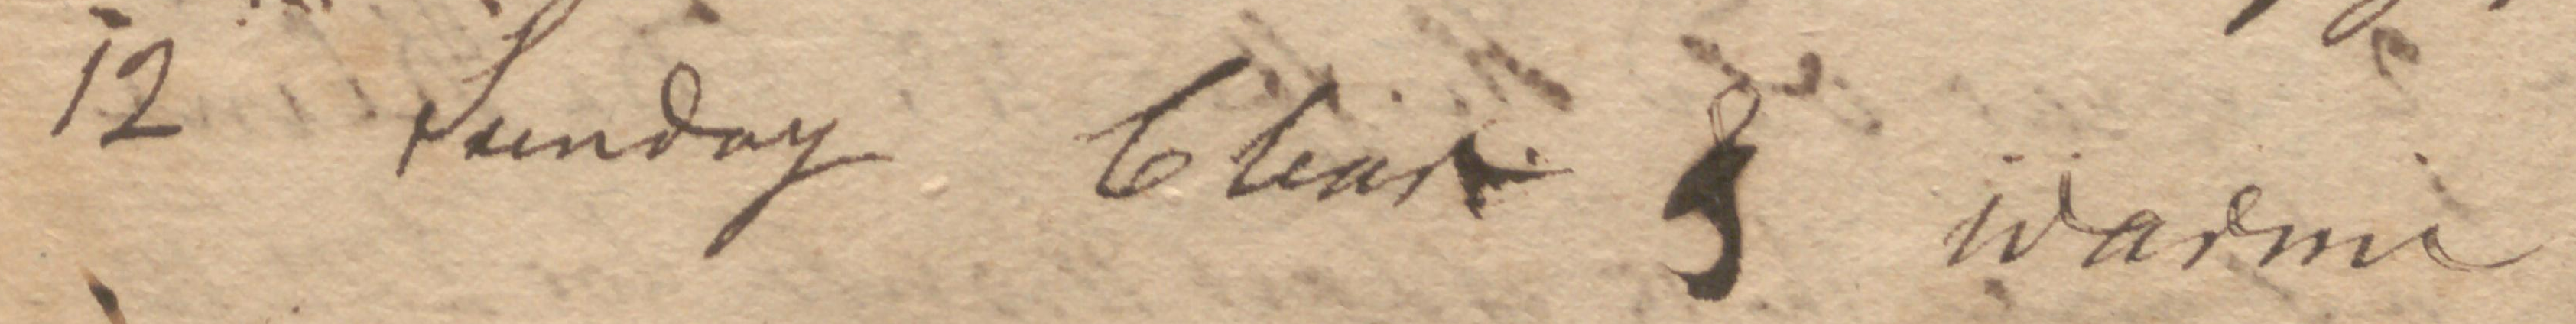12 Sunday Clear & warme
